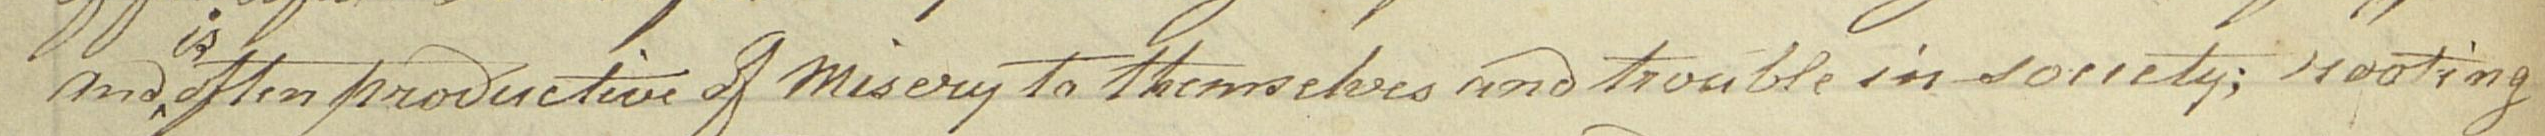And ^ often productive of Misery to themselves and trouble in society; rooting
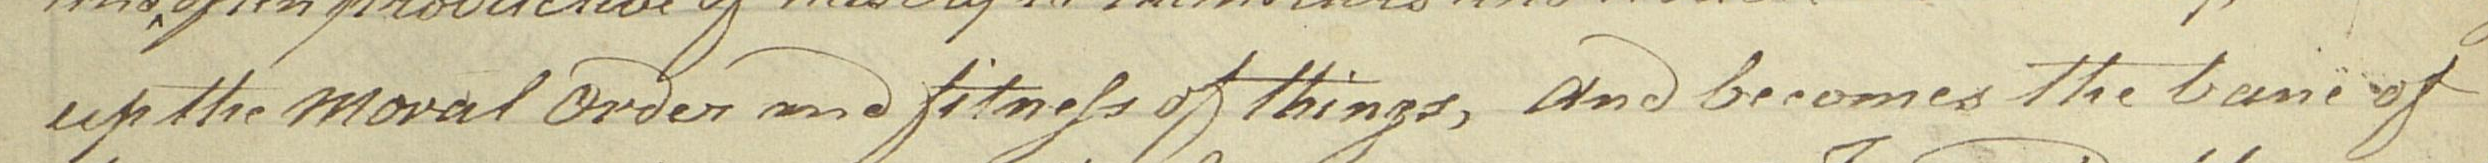up the moral order and fitness of things, And becomes the bane of
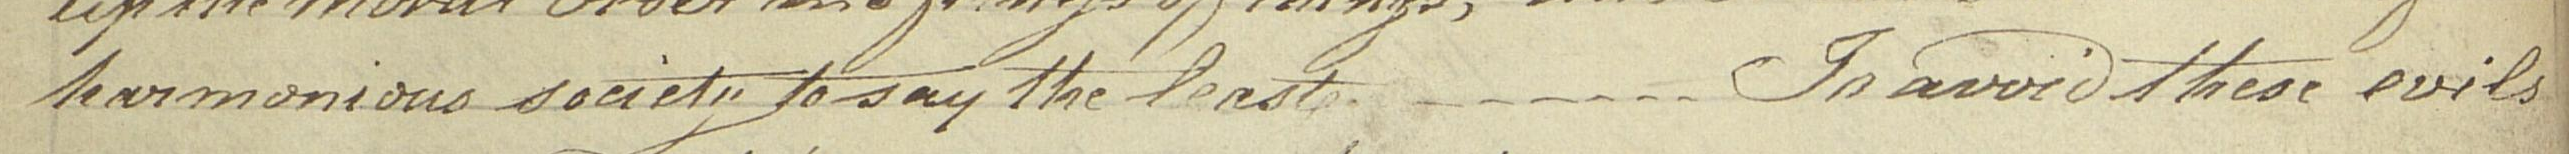harmonious society to say the least. To avoid these evils
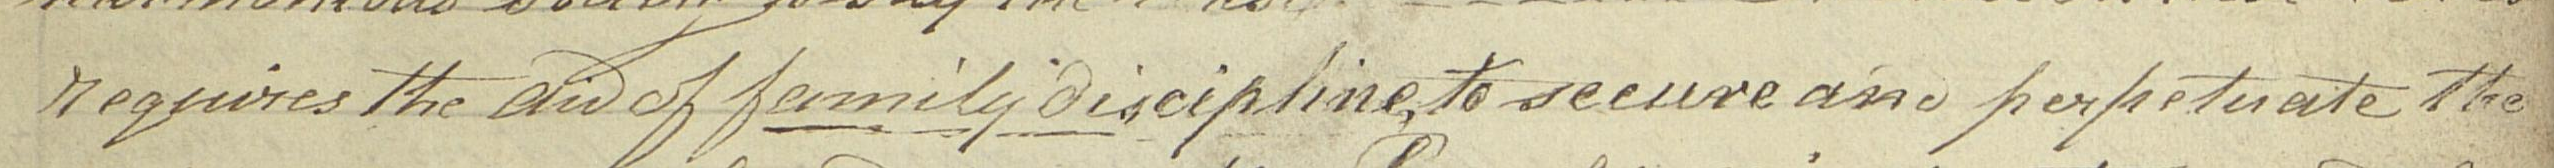requires the aid of family discipline, to secure and perpetuate the
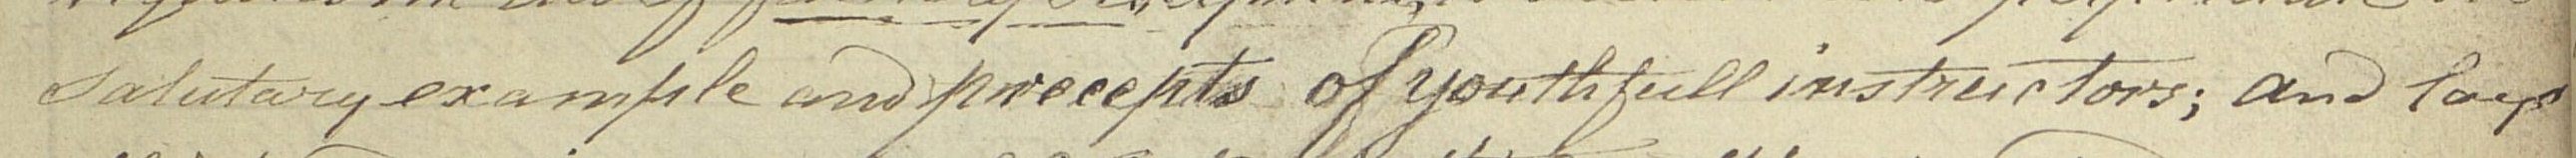salutary example and precepts of youthfull instructors; and lays
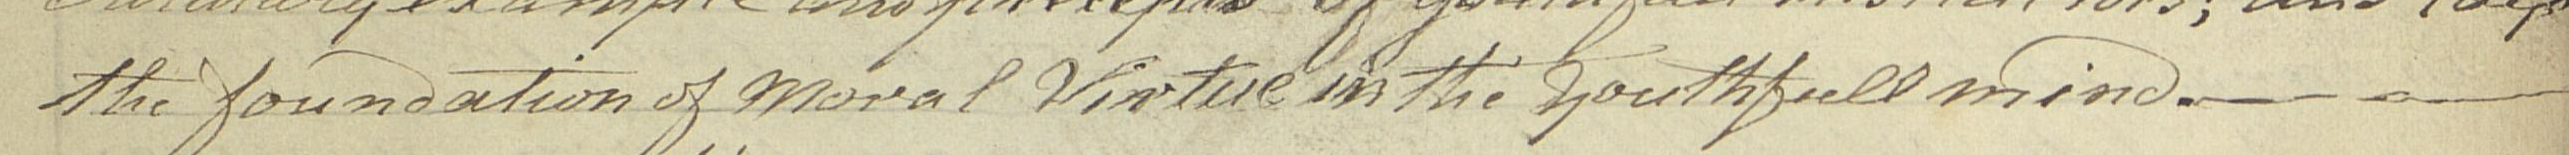the foundation of moral Virtue in the Youthfull mind.
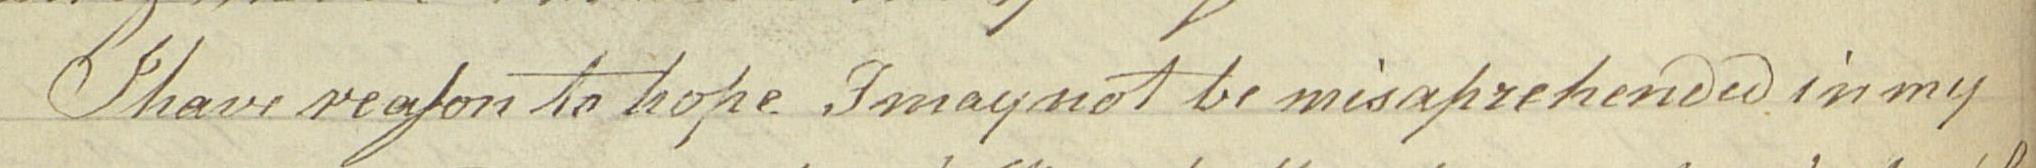I have reason to hope I may not be misaprehended in my
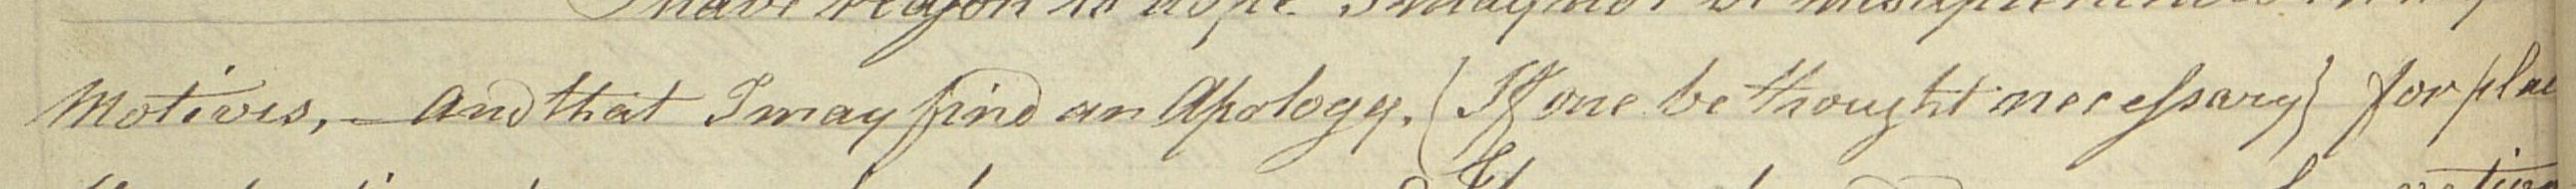Motives, and that I may find an Apology. (If one be thought necessary) for plac-
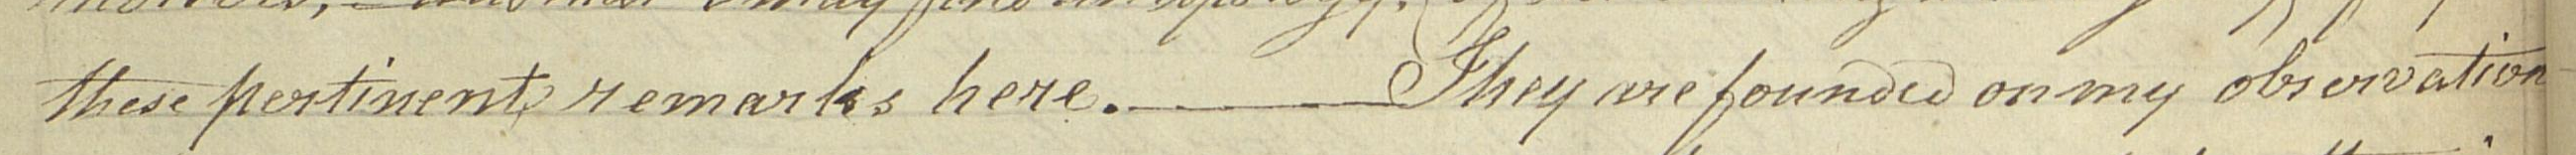these pertinent remarks here. They are founded on my observation
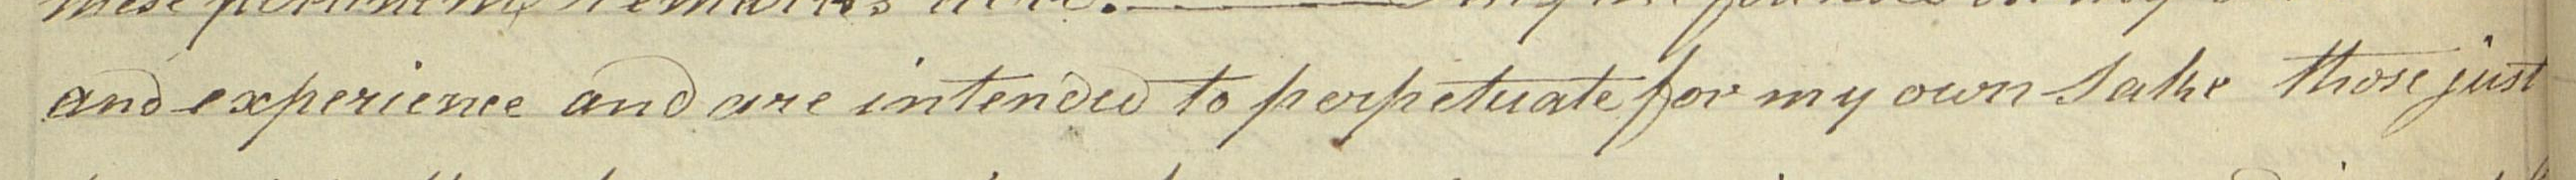and experience and are intended to perpetuate for my own Sake those just
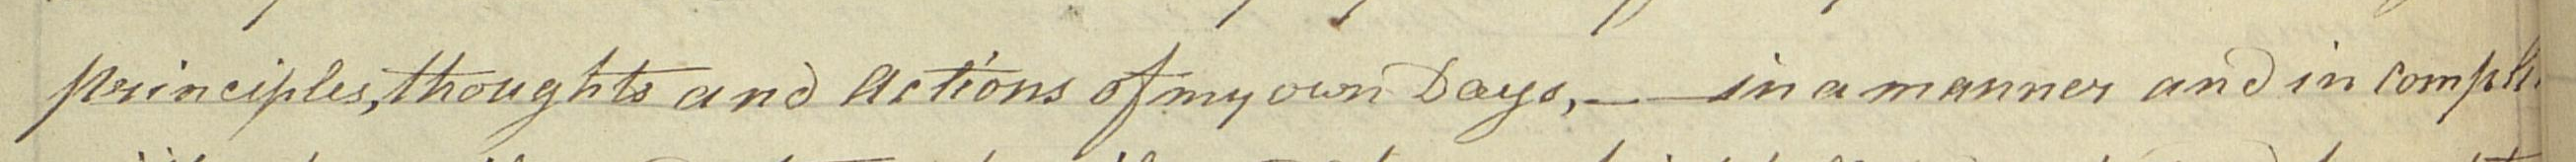principles, thoughts and Actions of my own Days, in a manner and in compli-
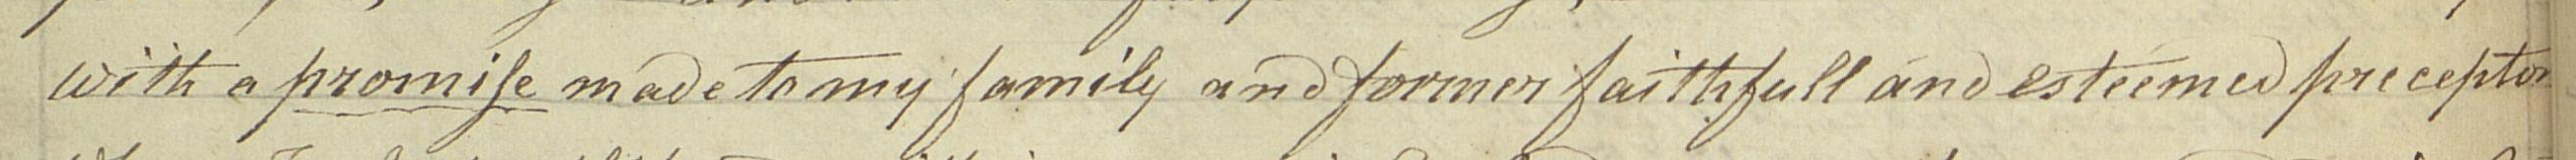with a promise made to my family and former faithfull and esteemed preceptor
